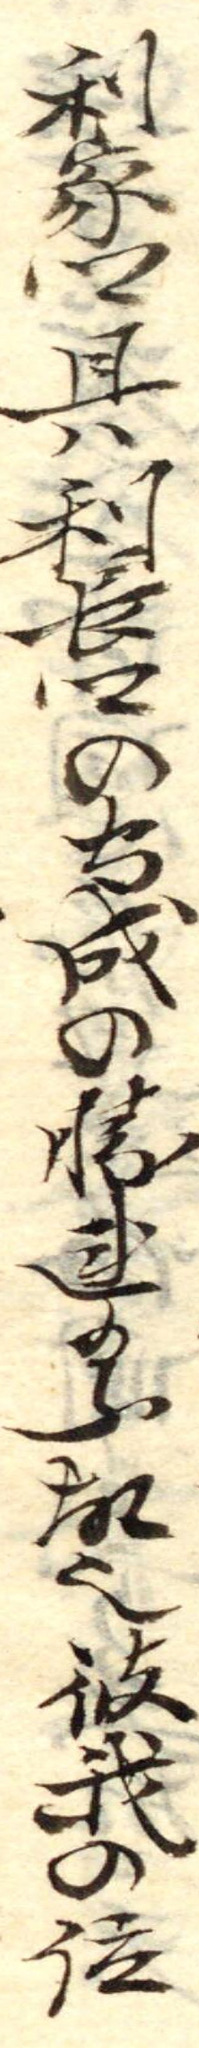利家郷且は利長郷の守成の勝連ゐふ故也彼我の位
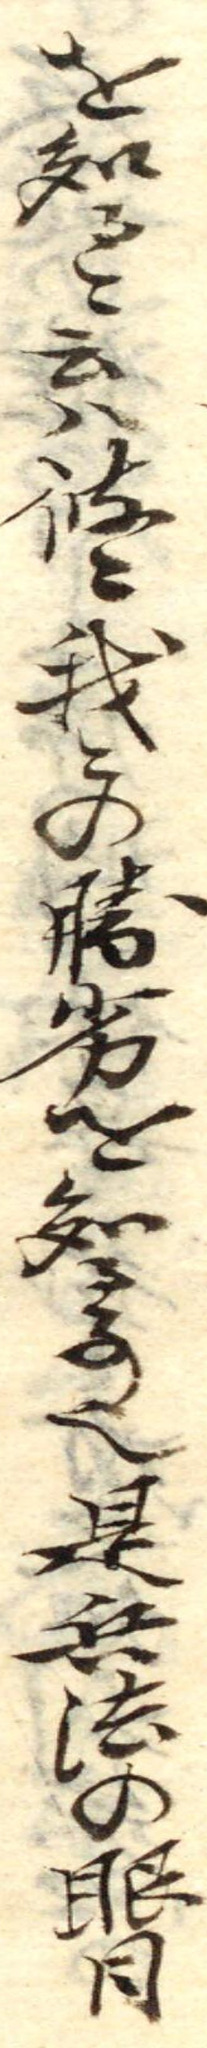を知ると云は彼と我との勝劣を知る事也是兵法の眼目
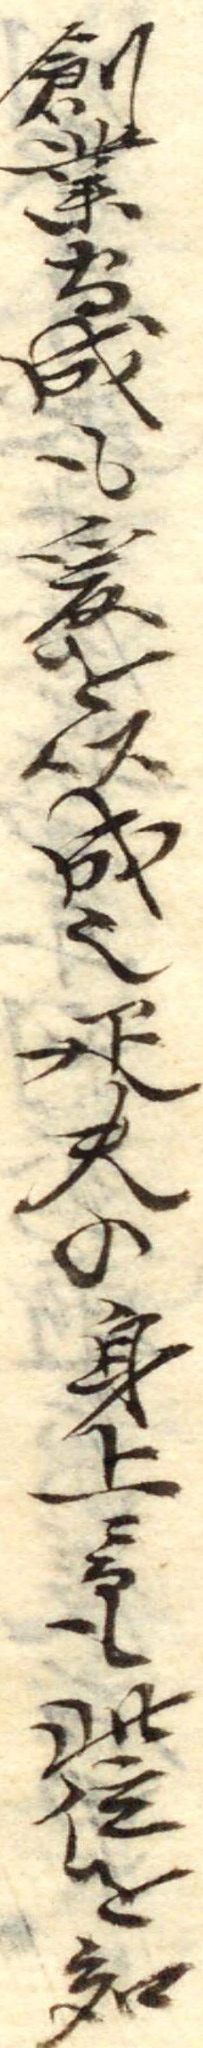創業守成も爰を以成也疋夫の身上に而も此位を知
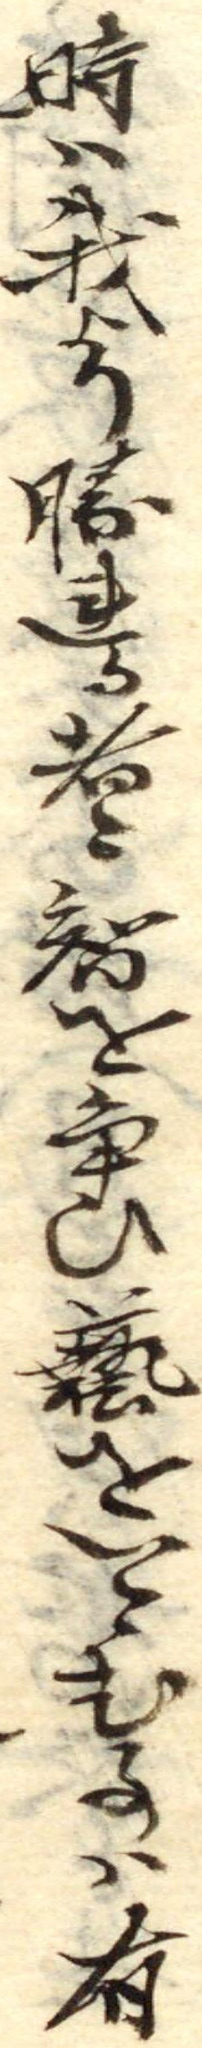時は我より勝連る者と智を争ひ藝をいたむ事は有
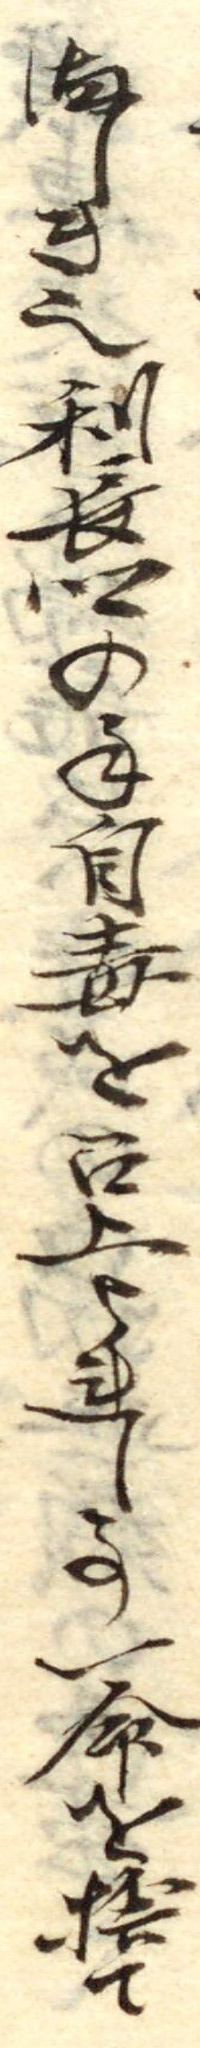満しき也利長郷の手自毒を召上ら連し事一命を捨て
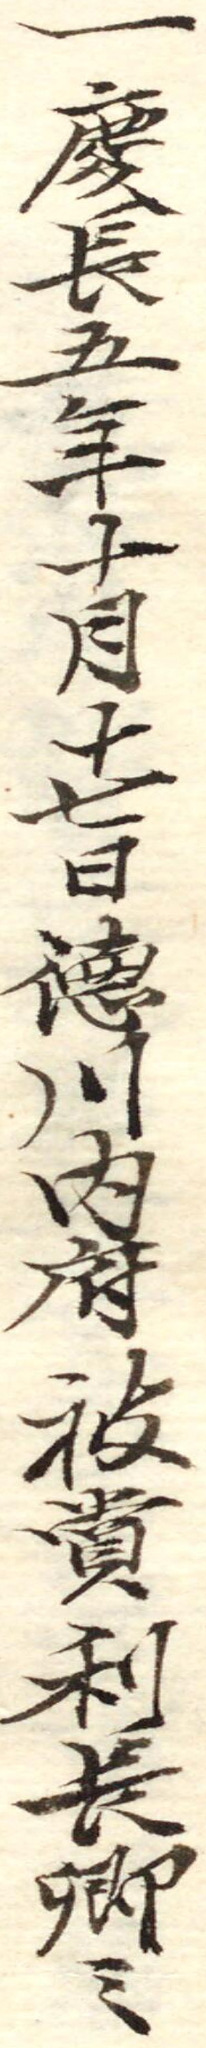一慶長五年十月十七日德川内府被賞利長卿之
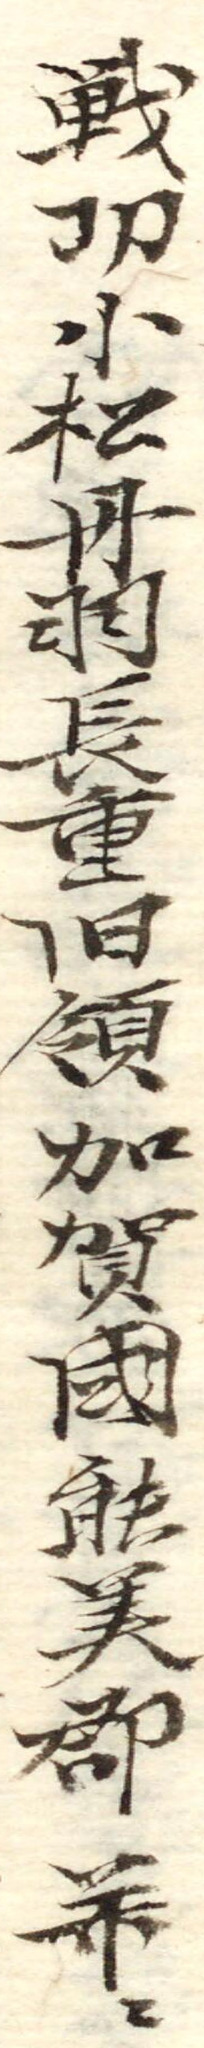戦功小松丹羽長重旧領加賀国能美郡幷に
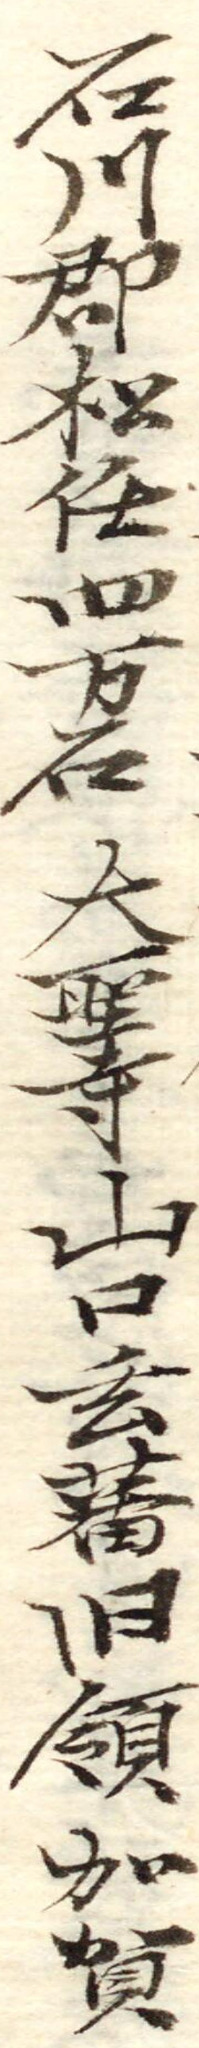石川郡松任四万石大聖寺山口玄蕃旧領加賀
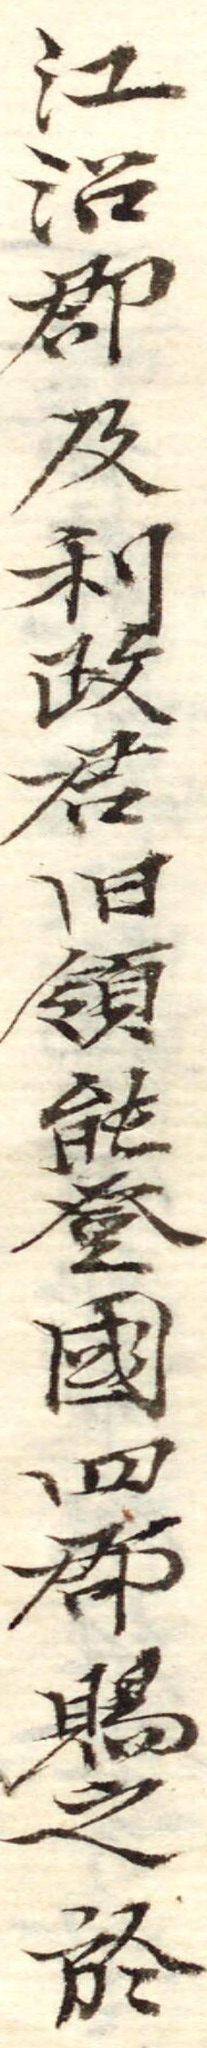江沼郡及利政君旧領能登国四郡賜之於
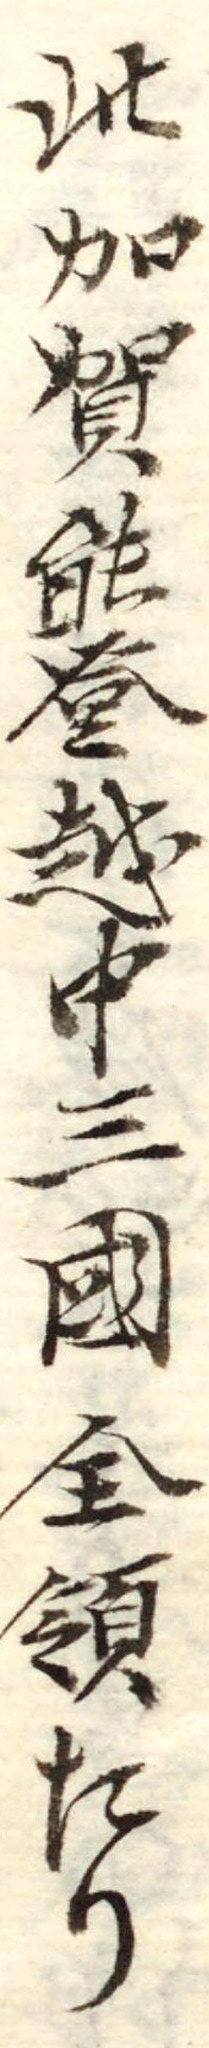此加賀能登越中三国全領たり
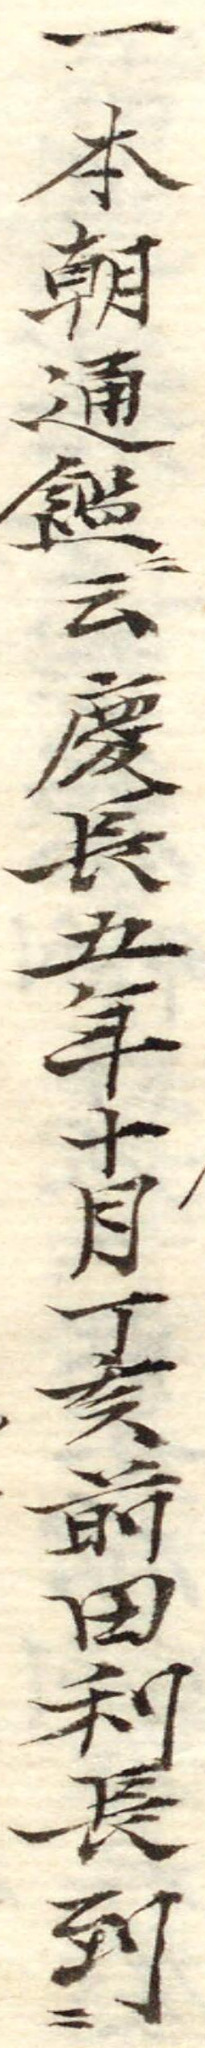一本朝通鑑に云慶長五年十月丁亥前田利長到
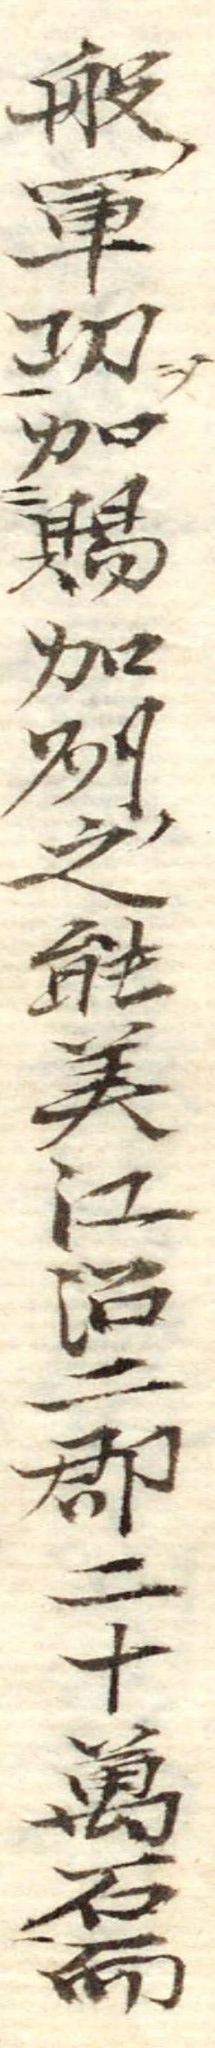般の軍功を加賜加州之能美江沼二軍二十萬石而
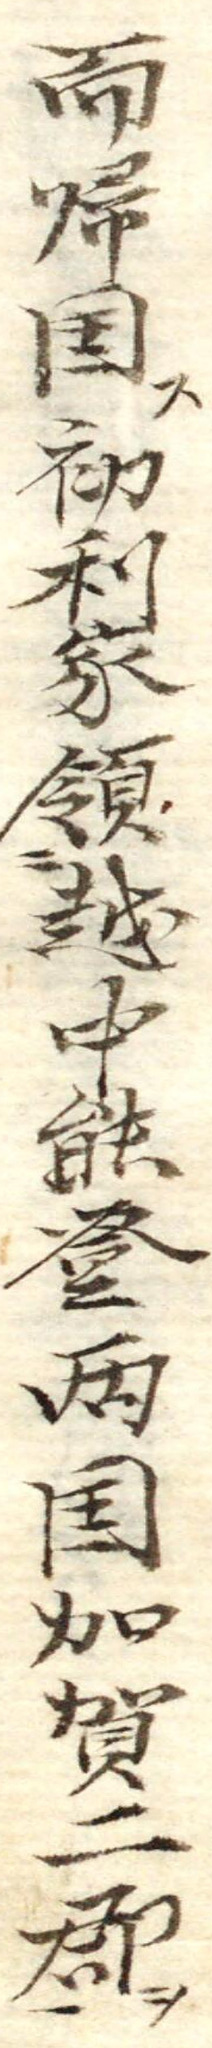而帰国す初利家良越中能登両国加賀二郡を

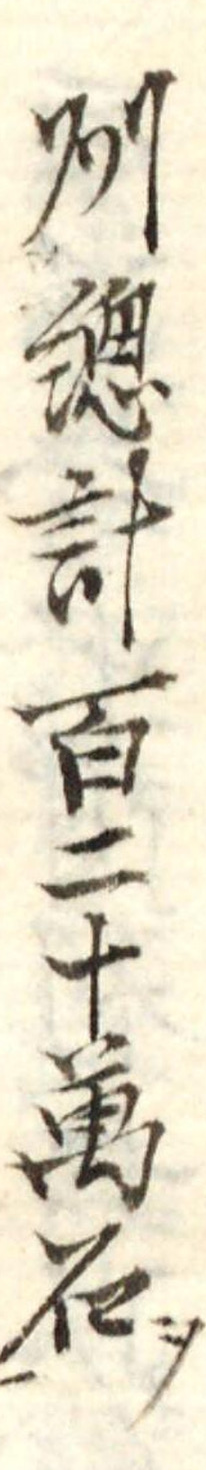州総計百二十萬石を
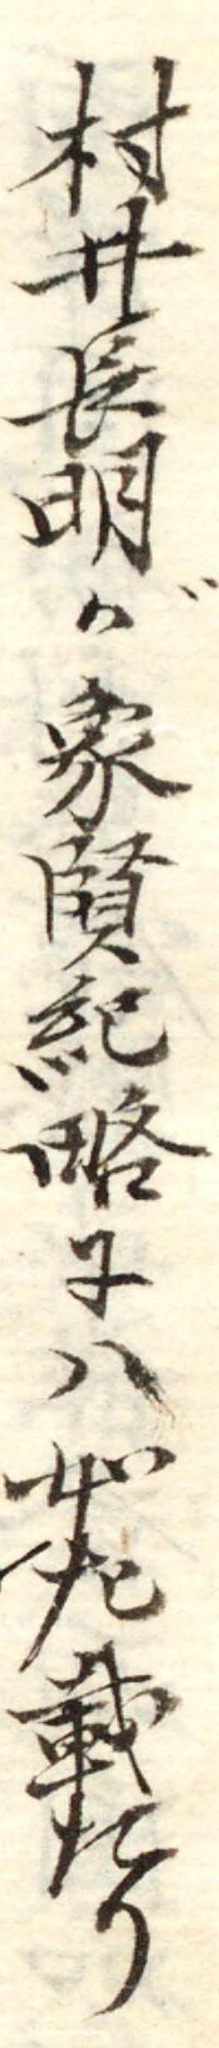村井長明が象賢紀略尓は如左載たり
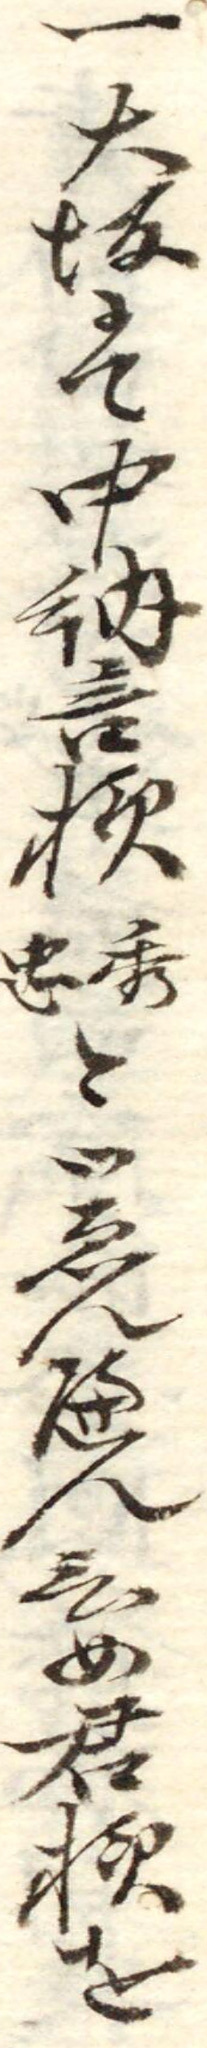一大坂尓て中納言様秀忠と御ゑん扁ん飛め君様を
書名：前田家封国証書集録
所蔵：Ishikawa Prefectural Library
